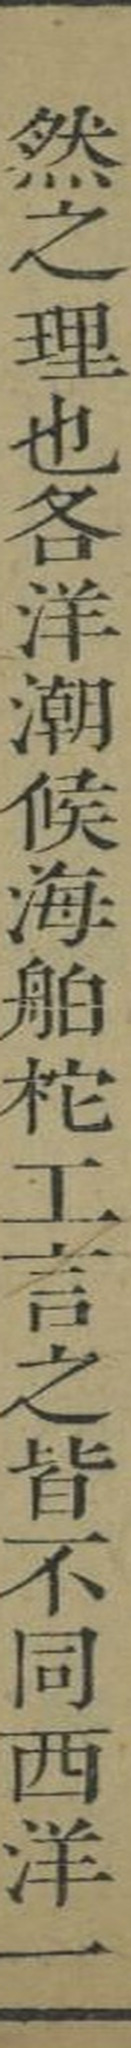然之理也各洋潮候海舶柁工言之皆不同西洋一
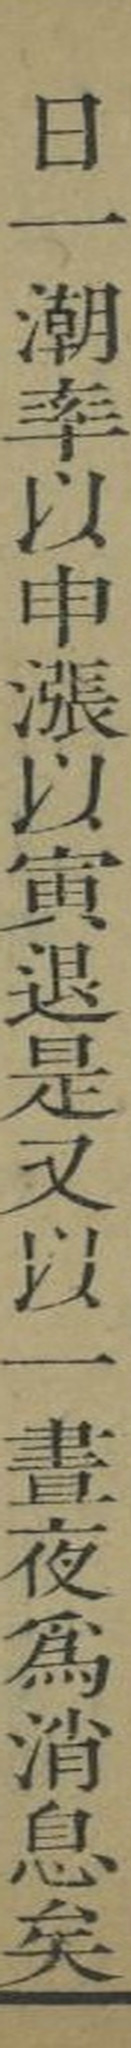日一潮率以申漲以寅退是又以一昼夜為消息矣
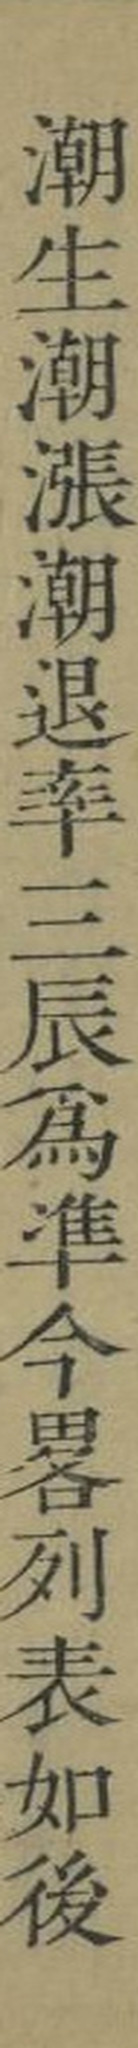潮生潮漲潮退率三辰為準今略列表如後
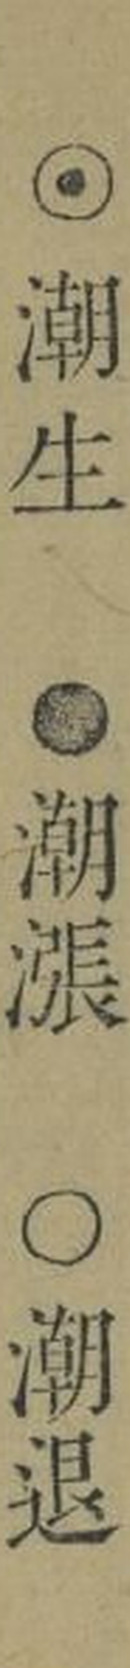⦿潮生●潮漲○潮退
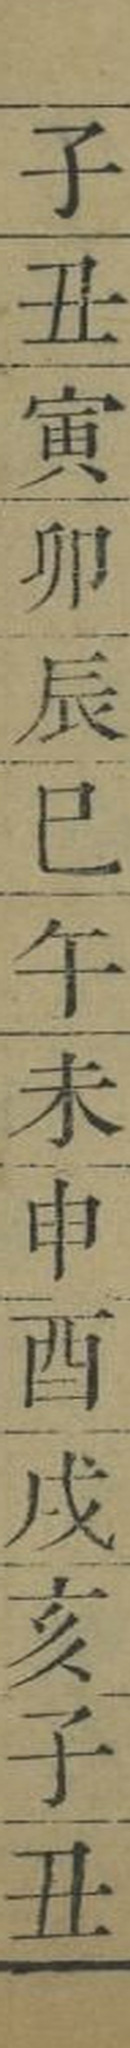子丑寅卯辰巳午未申酉戌亥子丑

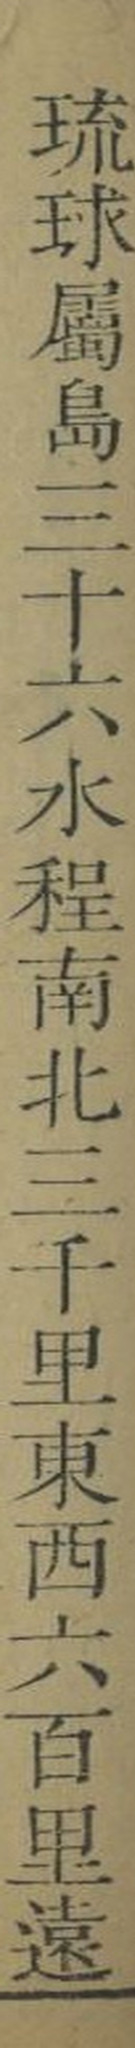琉球属島三十六水程南北三千里東西六百里遠
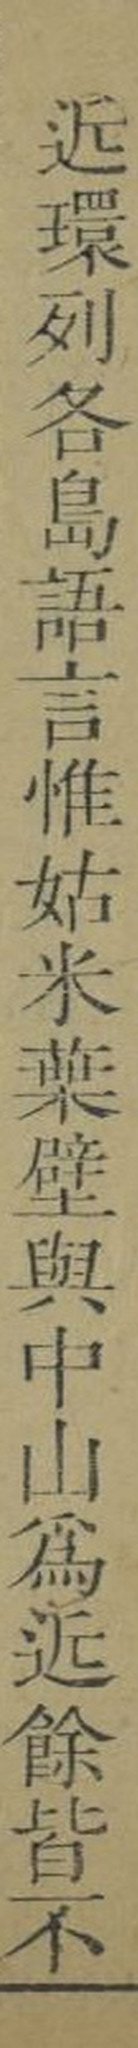近環列各島語言惟姑米葉壁与中山為近余皆不
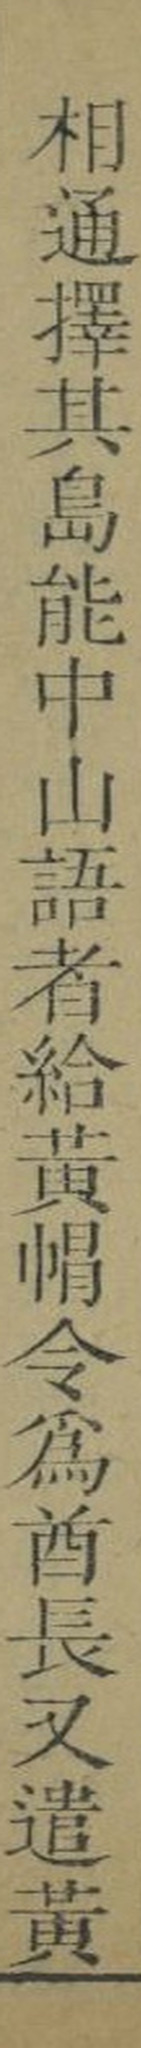相通択其島能中山語者給黄帽令為酋長又遣黄
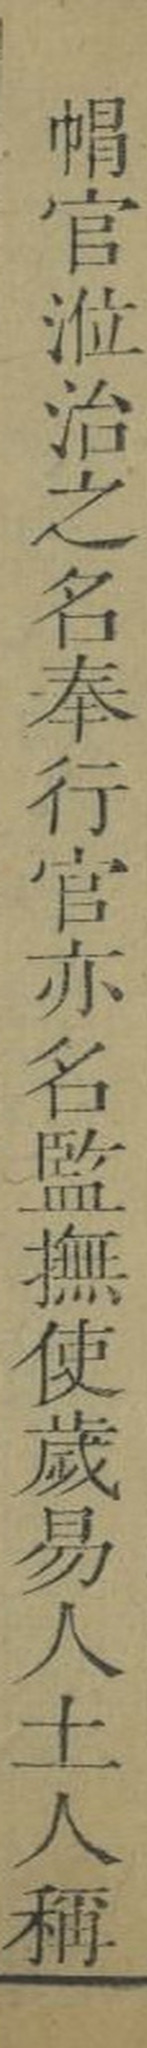帽官涖治之名奉行官亦名監撫使歳易人土人称
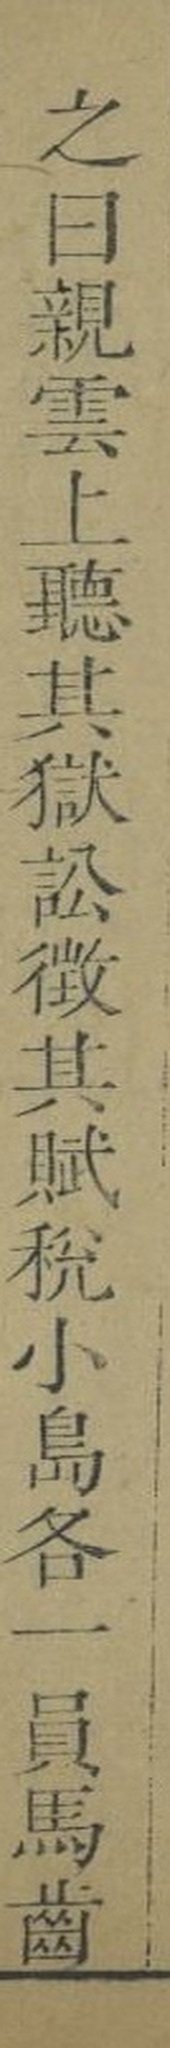之曰親雲上聴其獄訟徴其賦税小島各一員馬歯
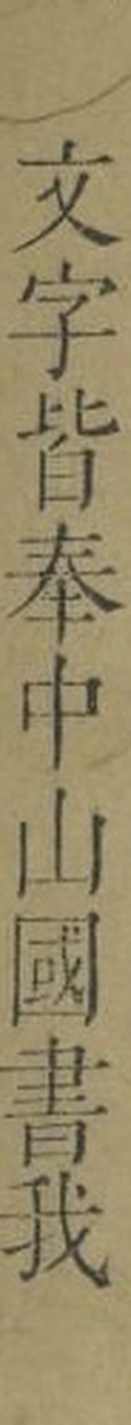文字皆奉中山国書我

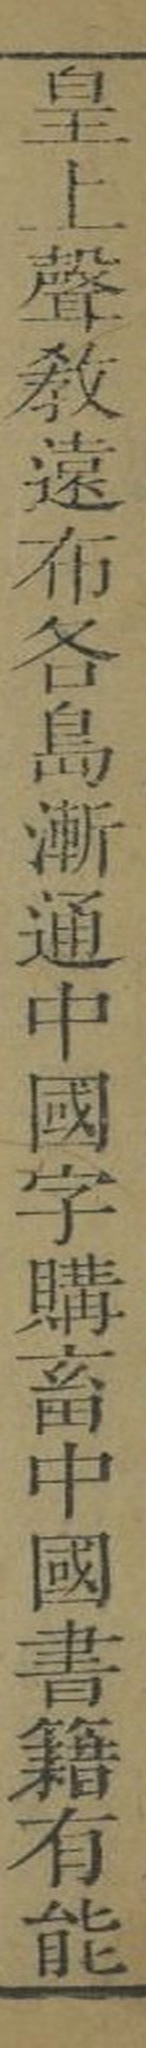皇上声教遠布各島漸通中国字購畜中国書籍有能
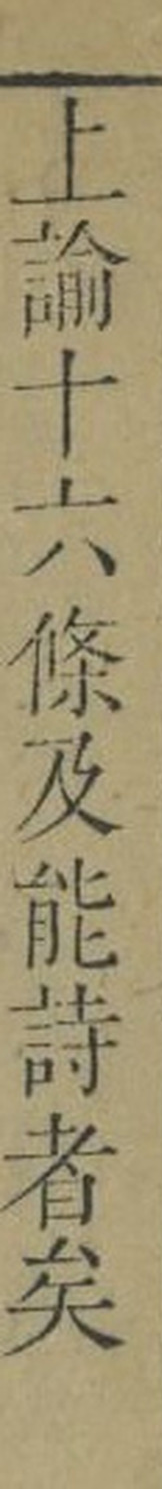上諭十六条及能詩者矣
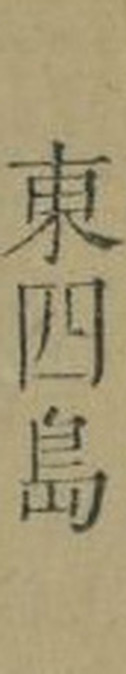東四島
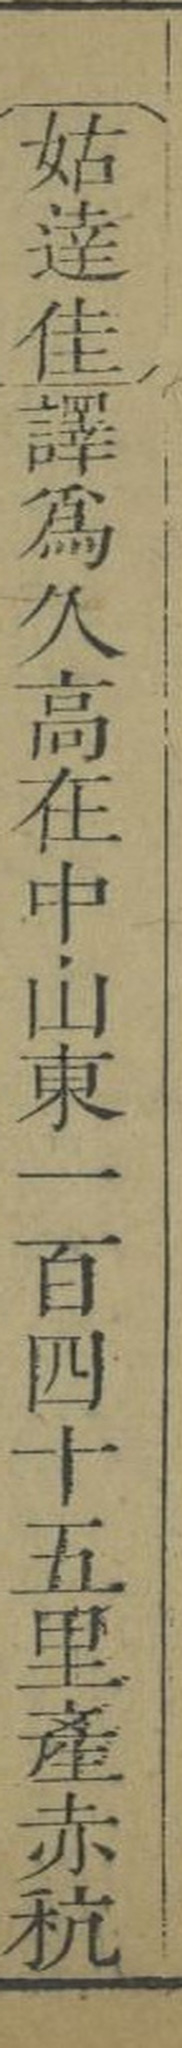[姑達佳]訳為久高在中山東一百四十五里産赤秔
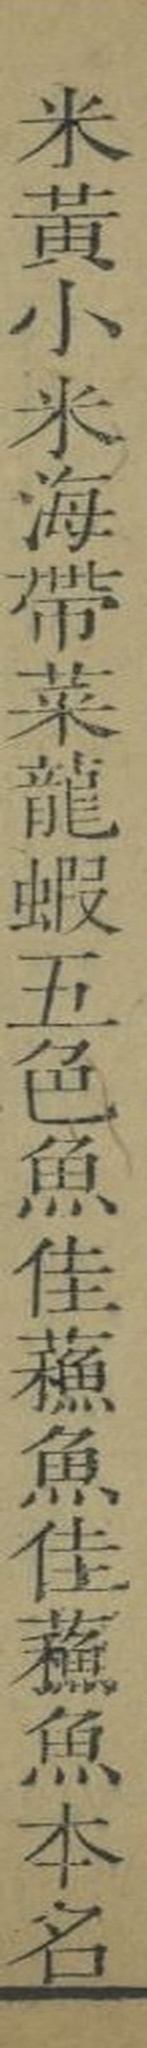米黄小米海帯菜竜蝦五色魚佳蘇魚佳蘇魚本名
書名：中山伝信録 巻四
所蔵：University of the Ryukyus Library
